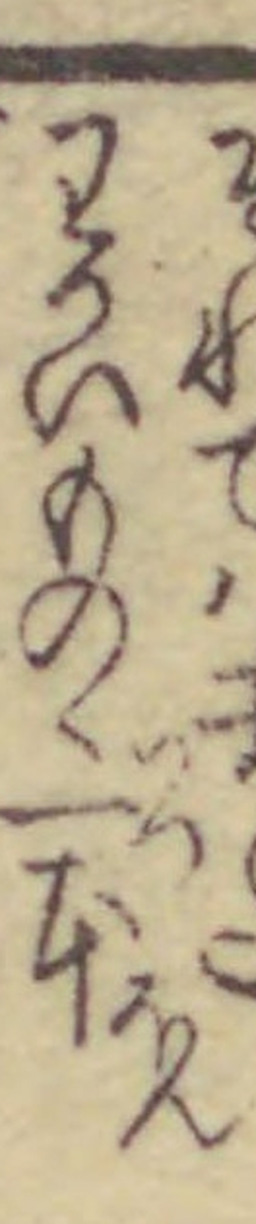わかいものゝ一本
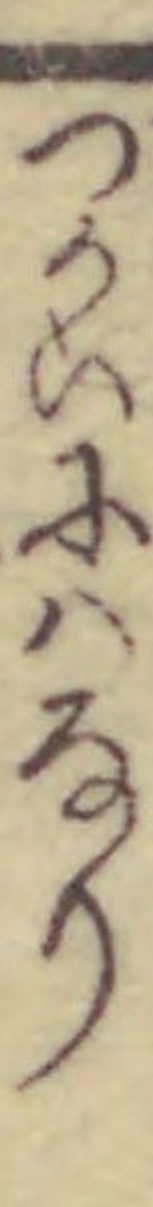づかひにはなり
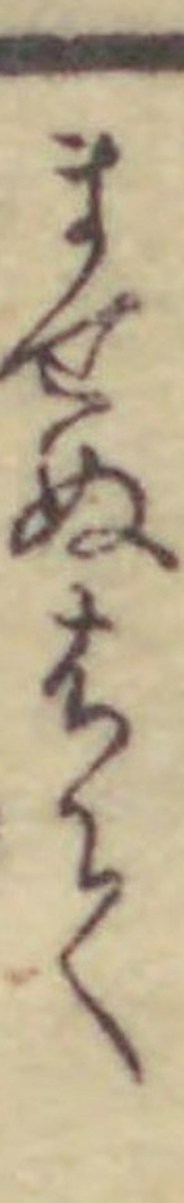ませぬはて
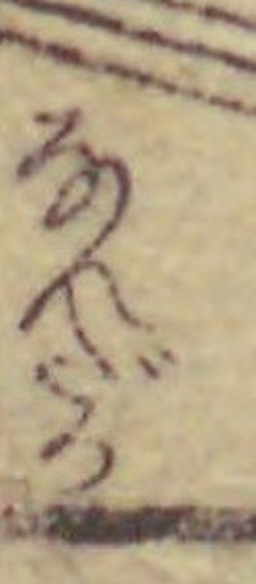なんだか
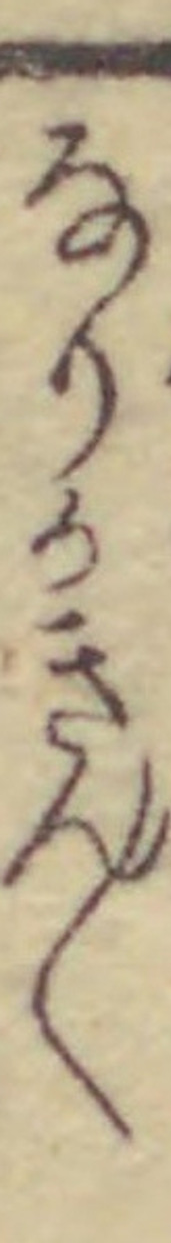なりかきん〳〵
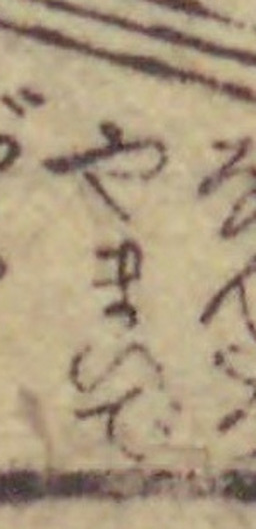やまいで
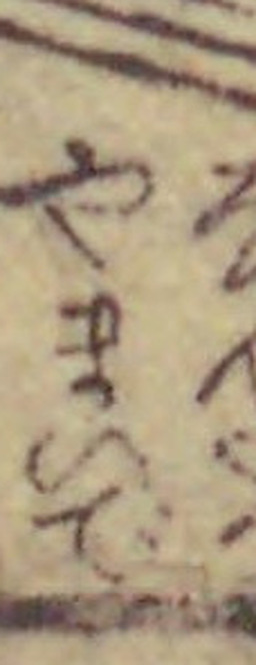やまいで
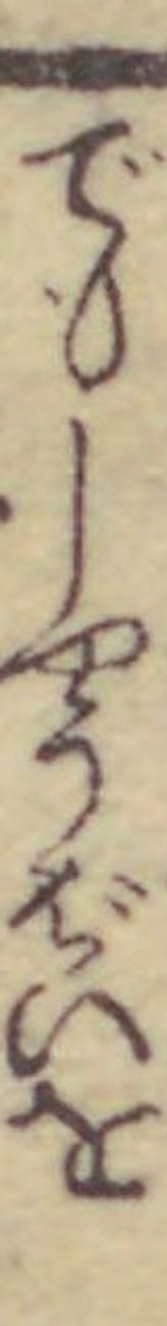でもしやうばいを
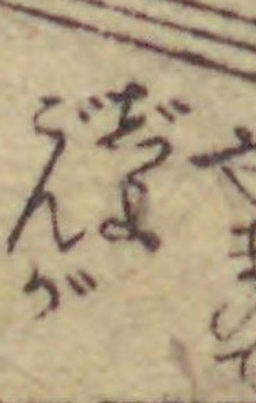だんが
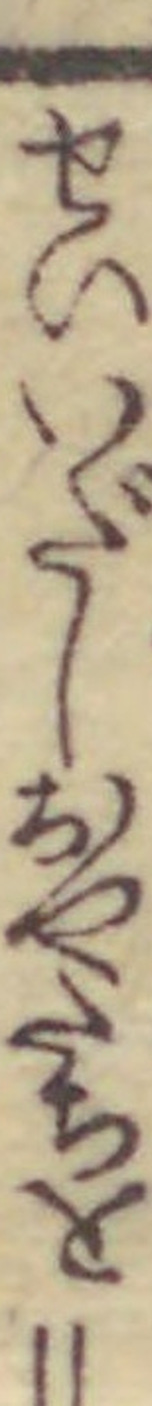せいいだしおやたちを
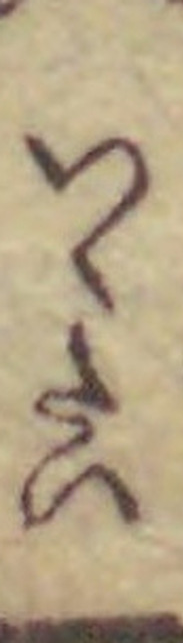いゝたい
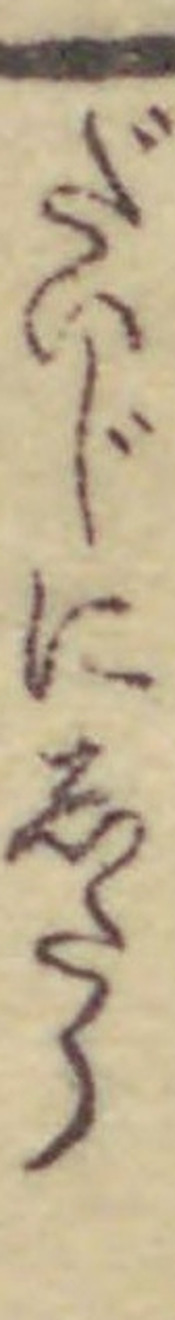だいじにしたら
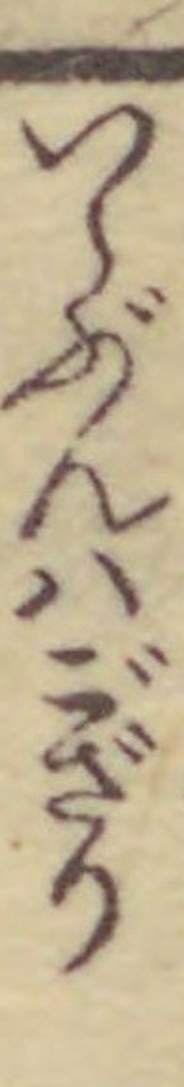いくぶんはござり
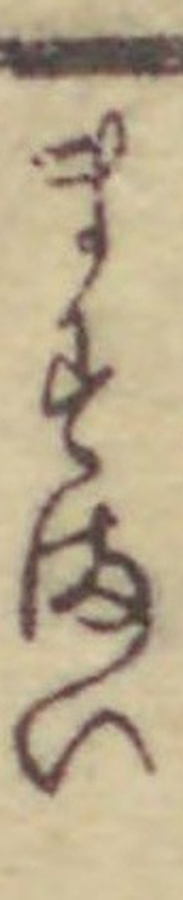ますまい
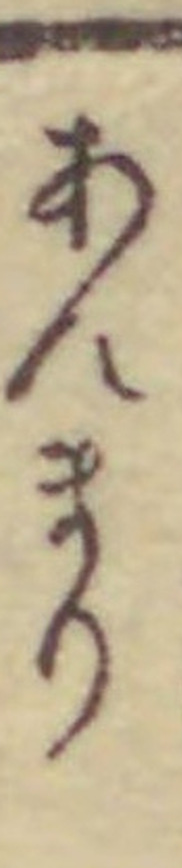あんまり
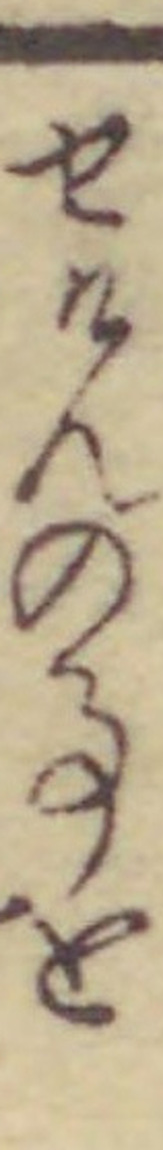せけんの事を
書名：大通人穴[サガシ] 3巻
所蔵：国立国会図書館 National Diet Library, JAPAN
